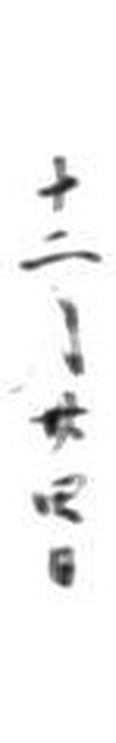十二月廿四日
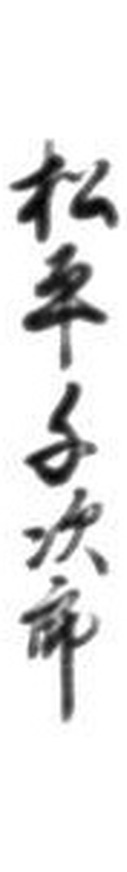松平千次郎
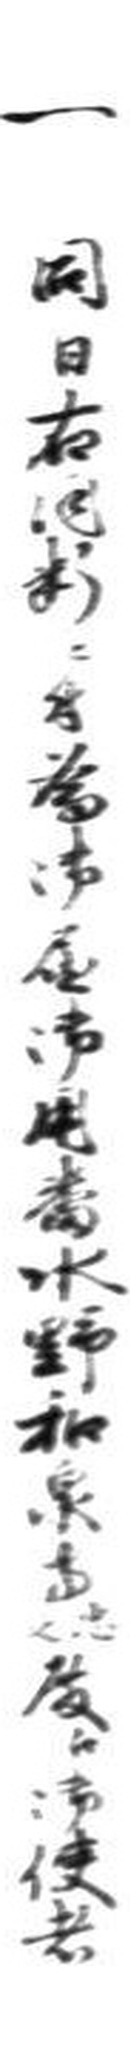一同日右同断ニ付為御届御用番水野和泉守忠之殿江御使者
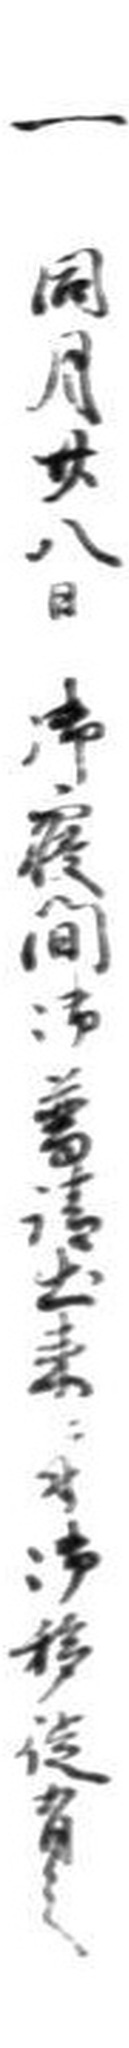一同月廿八日御寝間御普請出来ニ付御移徙有之
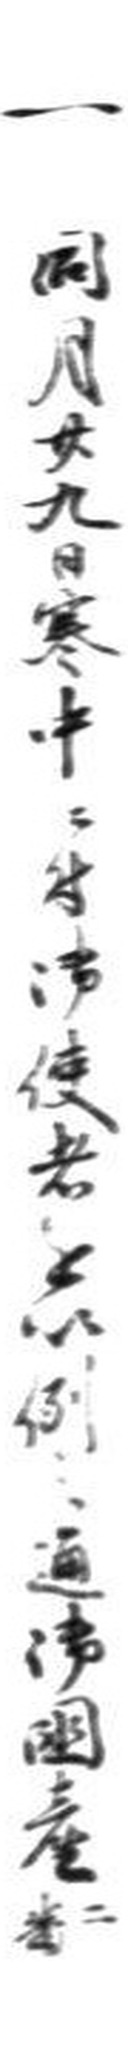一同月廿九日寒中ニ付御使者を以例之通御国産二番

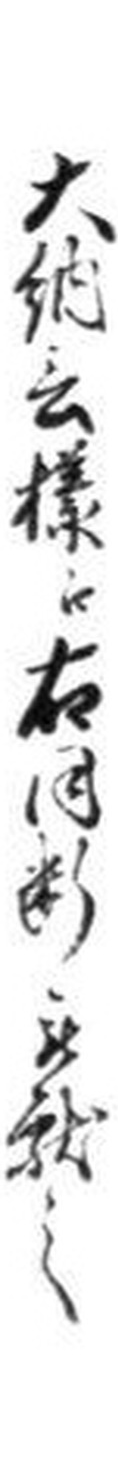大納言様江右同断被献之
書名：家譜 三十九 宗矩公 享保十年
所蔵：福井県文書館 Fukui Prefectural Archives
